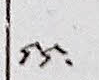55.
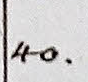40
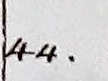44.
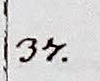37.
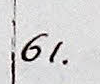61.
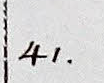41.
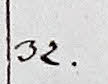32.
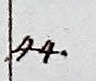44.
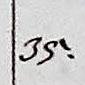35
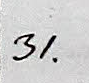31.
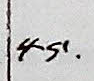45
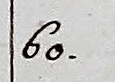60.
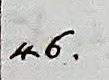46.
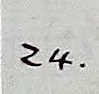24
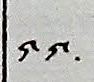55
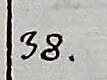38.
